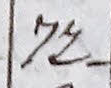72
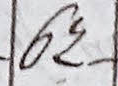62
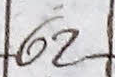62
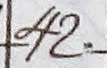42
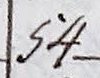54
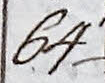64
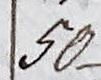50
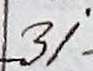31
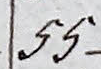55
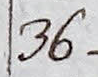36
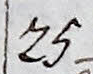25
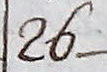26
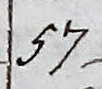57
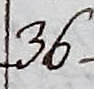36
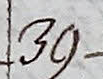39
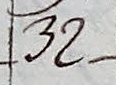32
